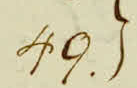49.
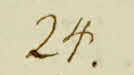24.
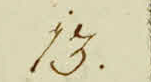13.
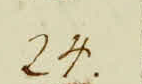24.
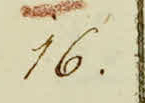16.
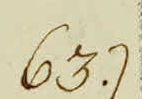63.
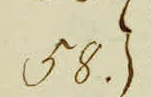58.
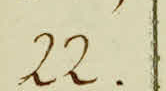22.
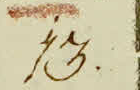13.
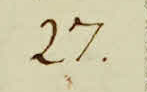27.
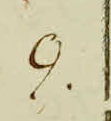9.
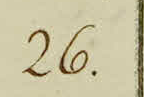26.
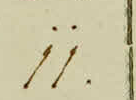11.
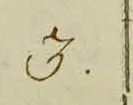3.
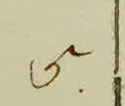5.
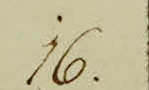16.
